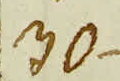30
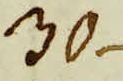30
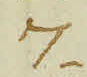7
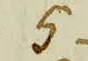5
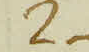2
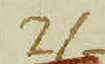21
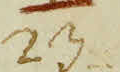23
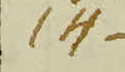14
